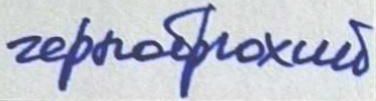чернобрюхий
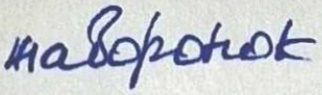жаворонок
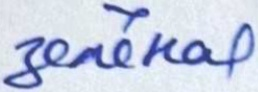зелёная
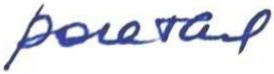рогатая
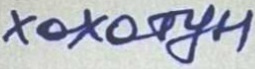хохотун
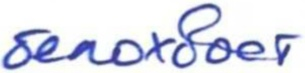белохвост
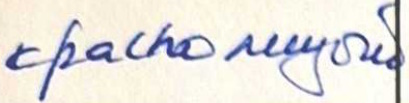краснолицый
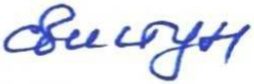свистун
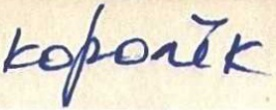королёк
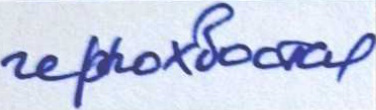чернохвостая
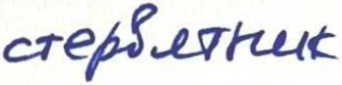стервятник
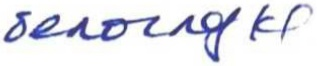белоглозка
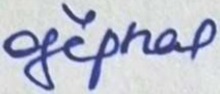одёрная
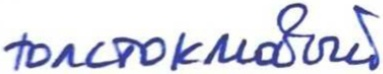толстоклювый
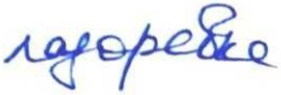лазоревка
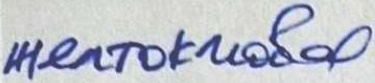желтоклювая
